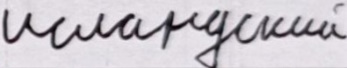исландский
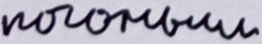погоныш
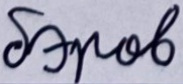бэров
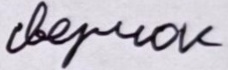сверчок
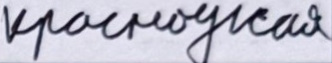красноухая
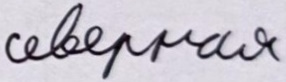северная
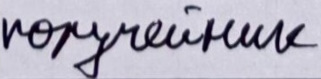поручейник
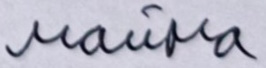майна
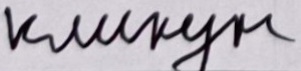кликун
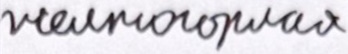желтогорлая
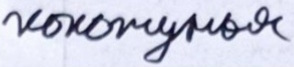хохотунья
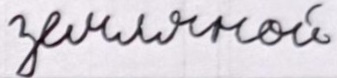земляной
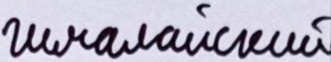гималайский
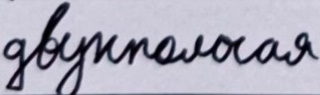двухполосая
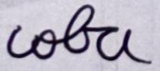сова
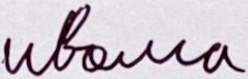иволга
